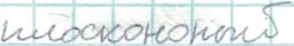плоскононый
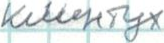клинтух
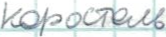коростель
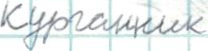курганник
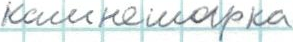камнешарка
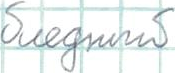бледный
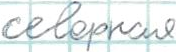северная
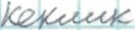кеклик
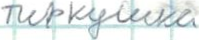тиркушка
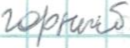горный
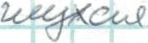глухая
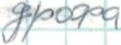дрофа
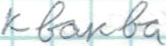кваква
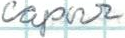сарыч
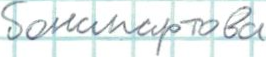бонапартова
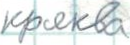кряква
